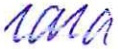гага
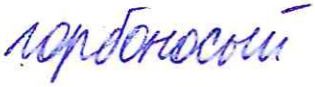горбоносый
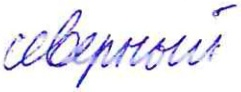северный
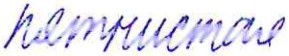пятнистая
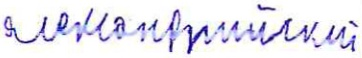александрийский
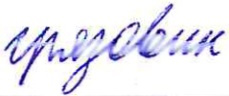грязовик
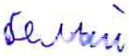белый
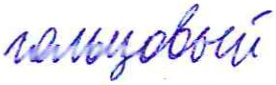гольцовый
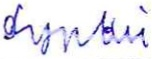бурый
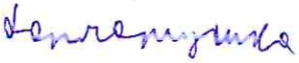бормотушка
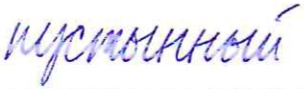пустынный
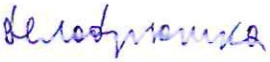белобрюшка
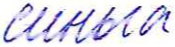синьга
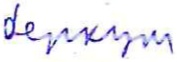беркут
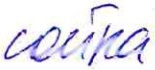сойка
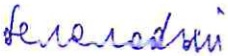белолобый
